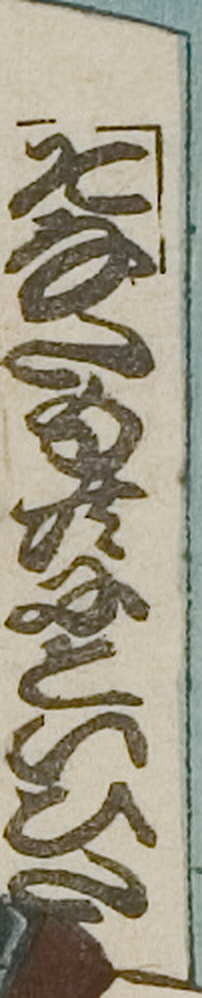〽そなたも共にといひた
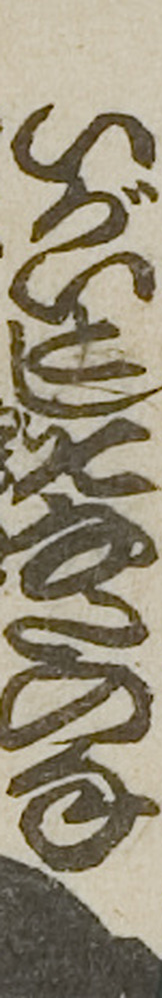いがいとしそなたの手
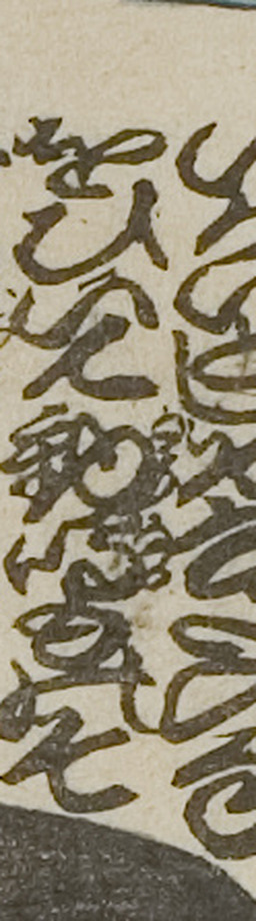をひいて動鳴ものそ
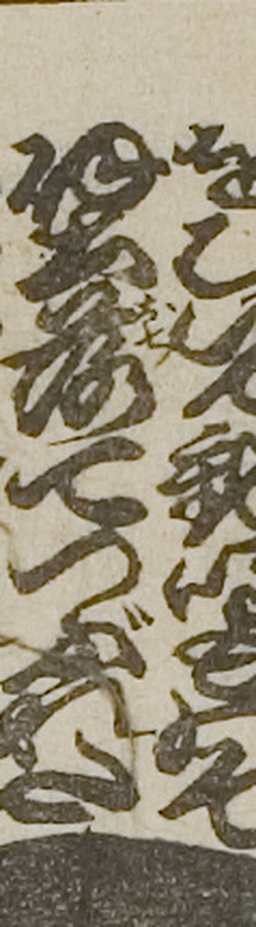壁落てつぶれた
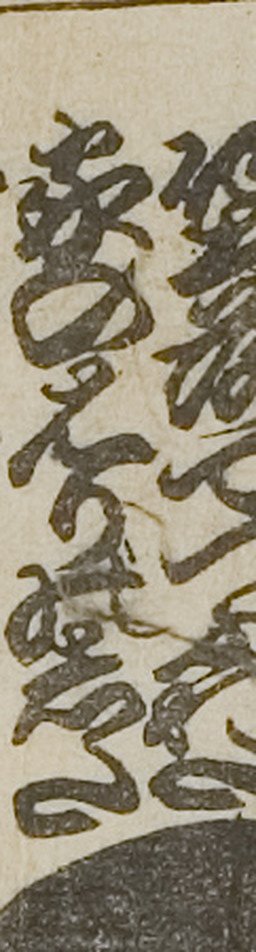家のはりのした
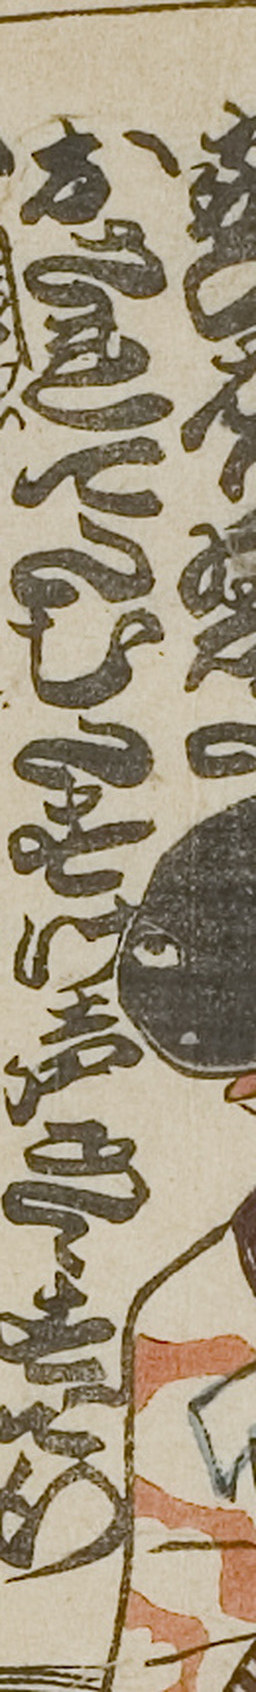おされてたむたすけ声きゝすて行
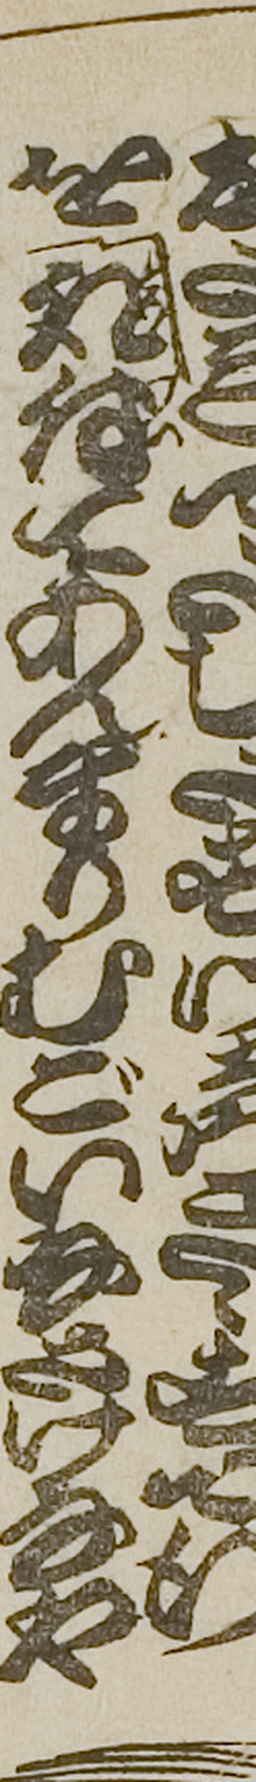を〽取付てあんまりむごいなさけなや
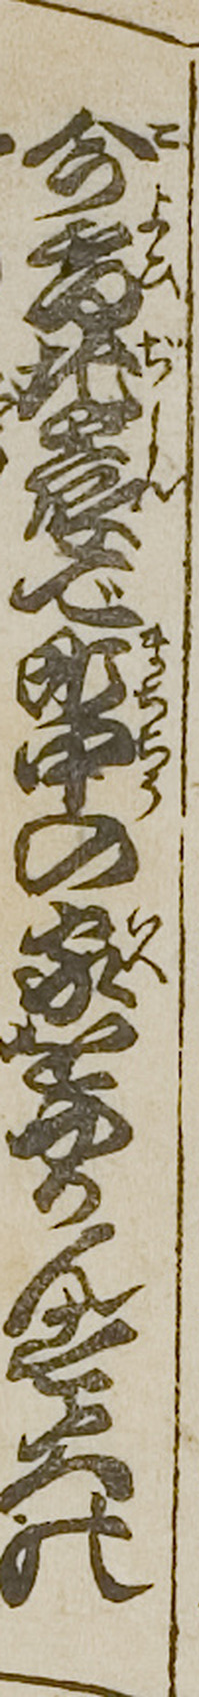今宵地震で町中の家をやかんす火の
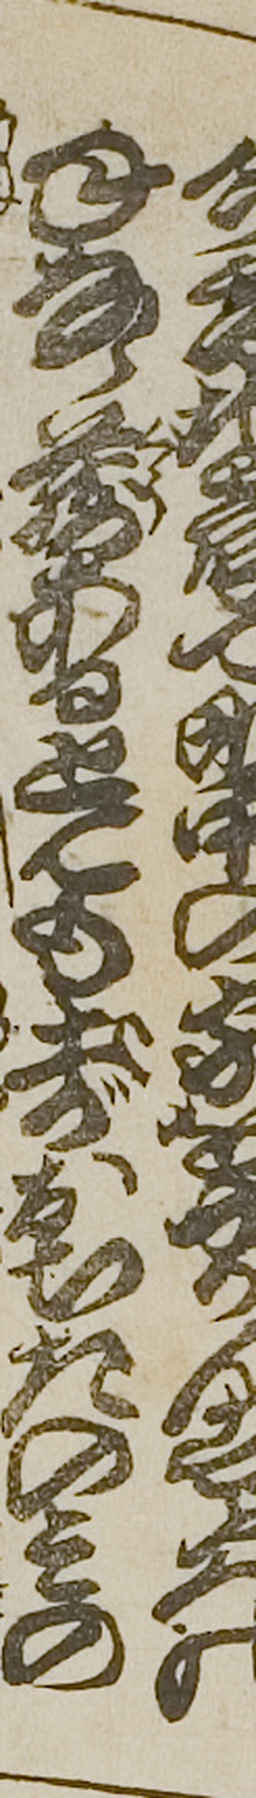手なら蔵あるとても土がおちたのみの
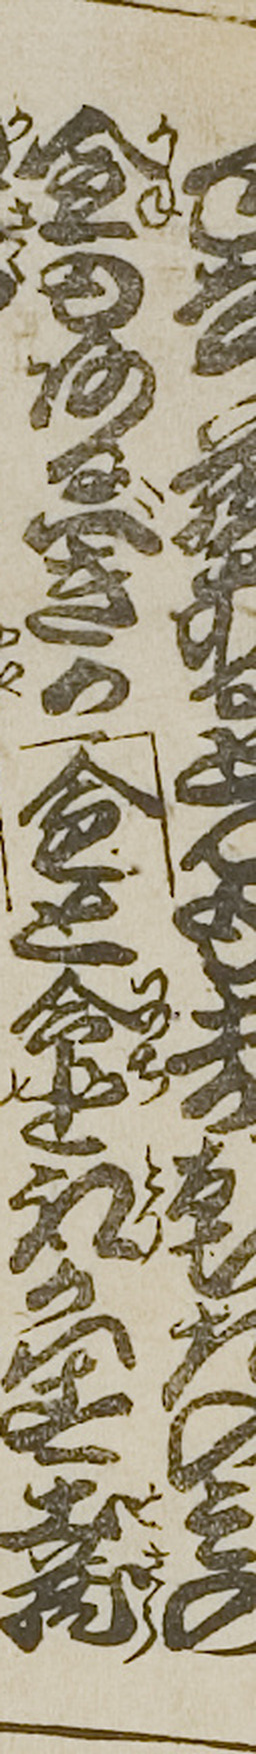金もあるべきか〽金と命を取かはす土蔵
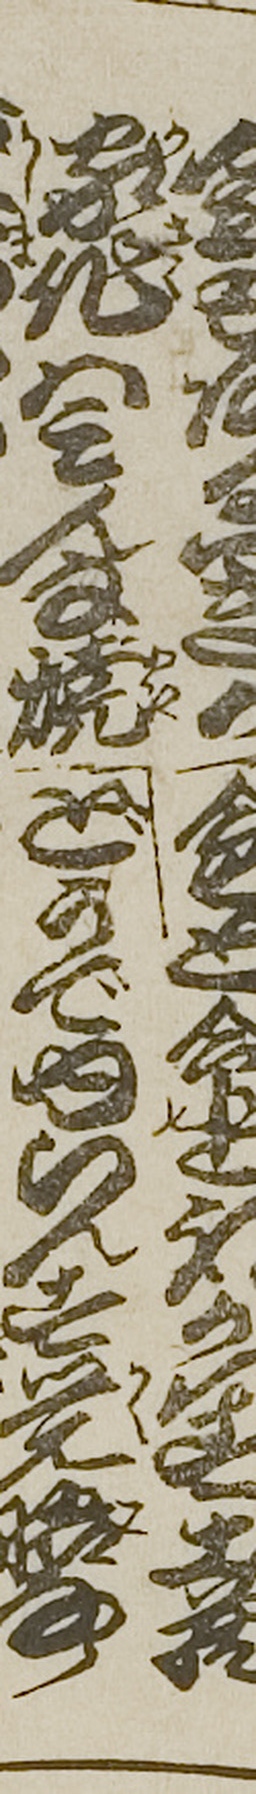家作はみんな焼〽どうでゆらんす覚悟なら
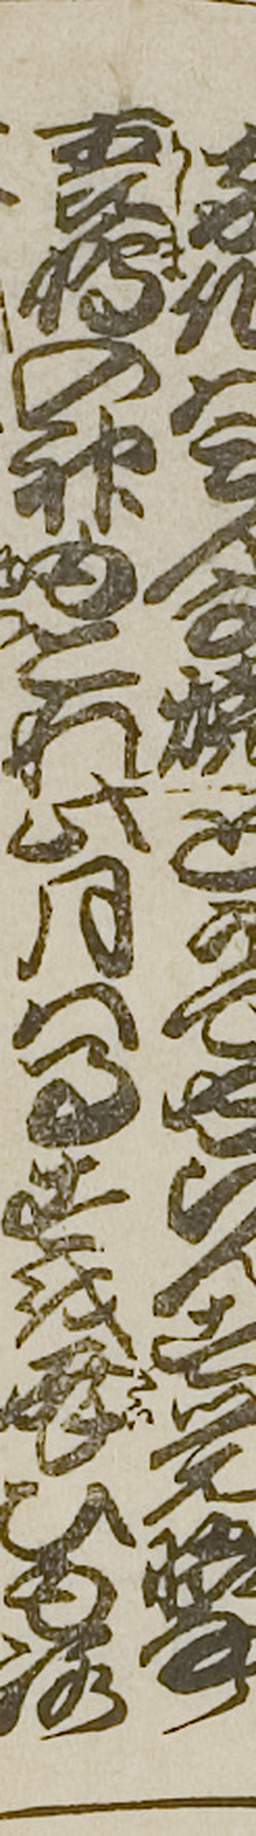鹿島の神もこれ此月はるすを幸ひもろ
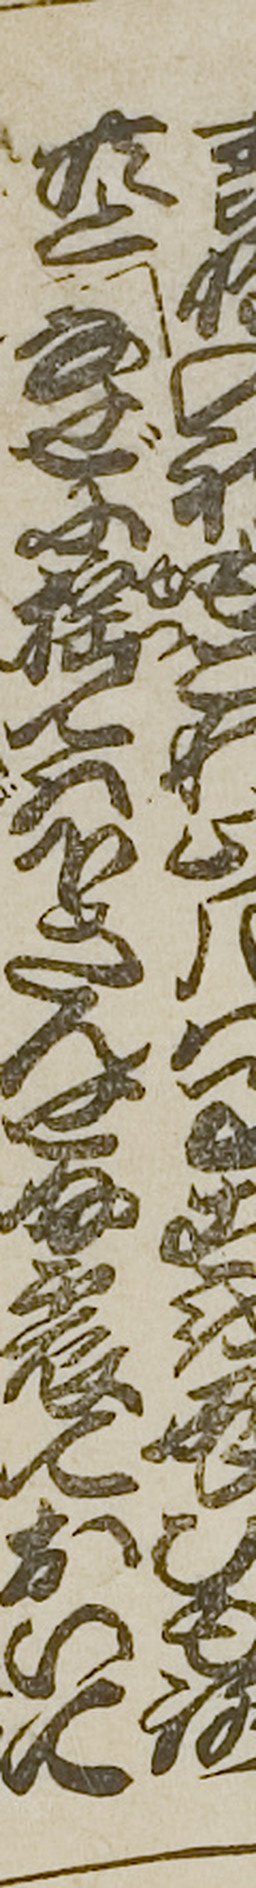共と〽なぜに揺ては下さんせぬ震ておいて
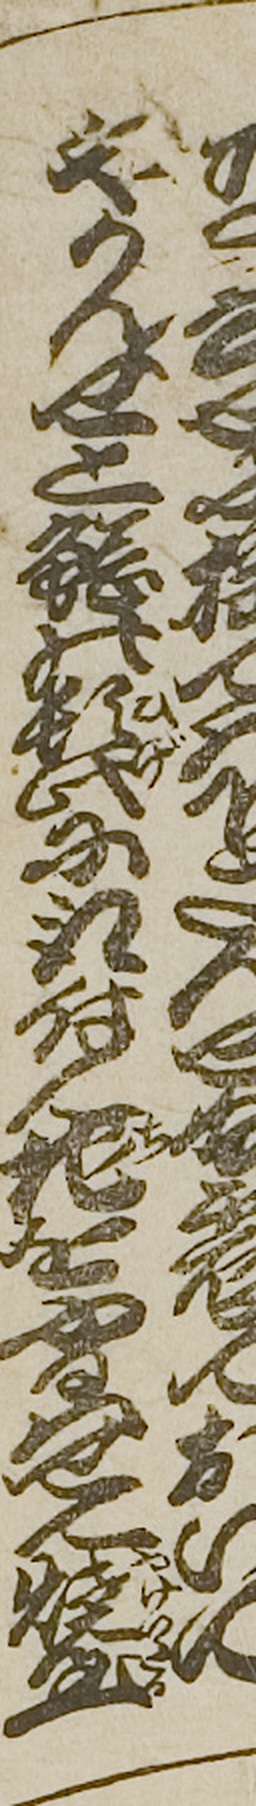やかんせと鯰の髭に取付て地をふるはせて焼至
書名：村里時四郎 明烏花焼衣
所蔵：東京大学総合図書館 General Library in the University of Tokyo, JAPAN
